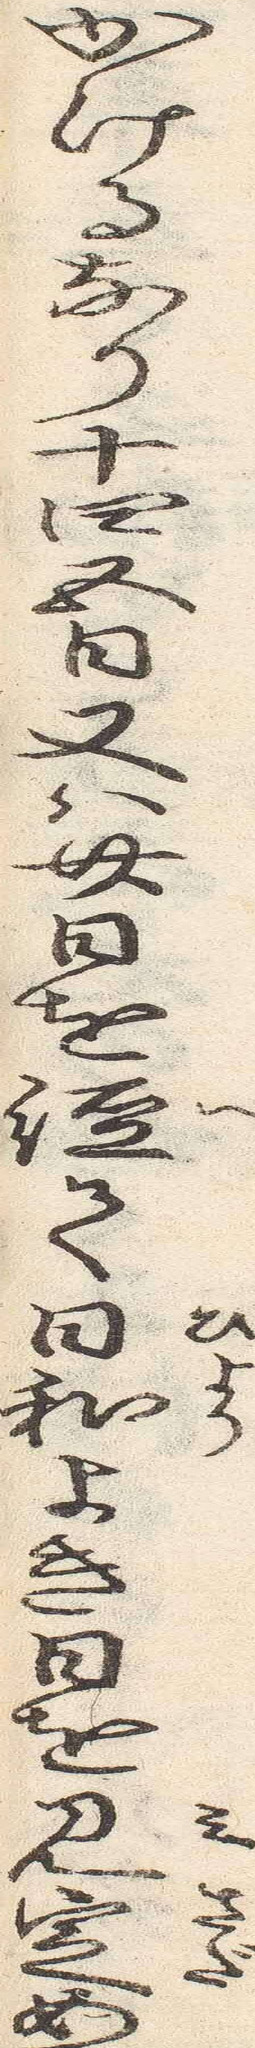かけるなり十四五日又は廿日を経て日和よき日を見定め
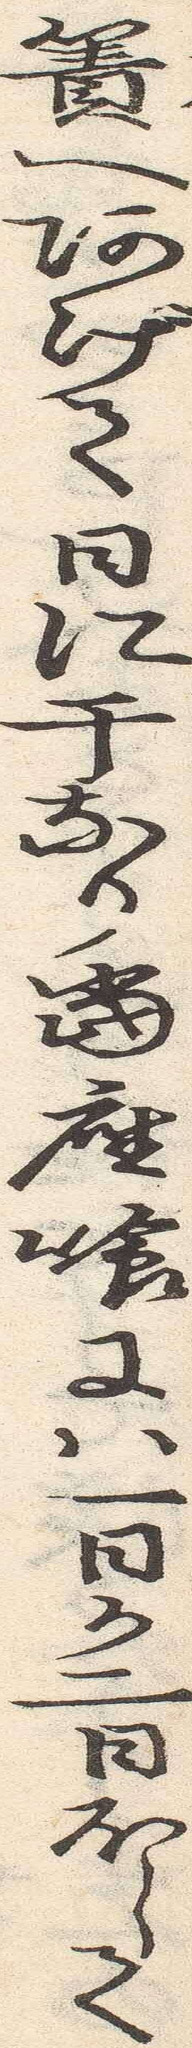簀へあげて日に干なり当座喰には一日か二日ほして
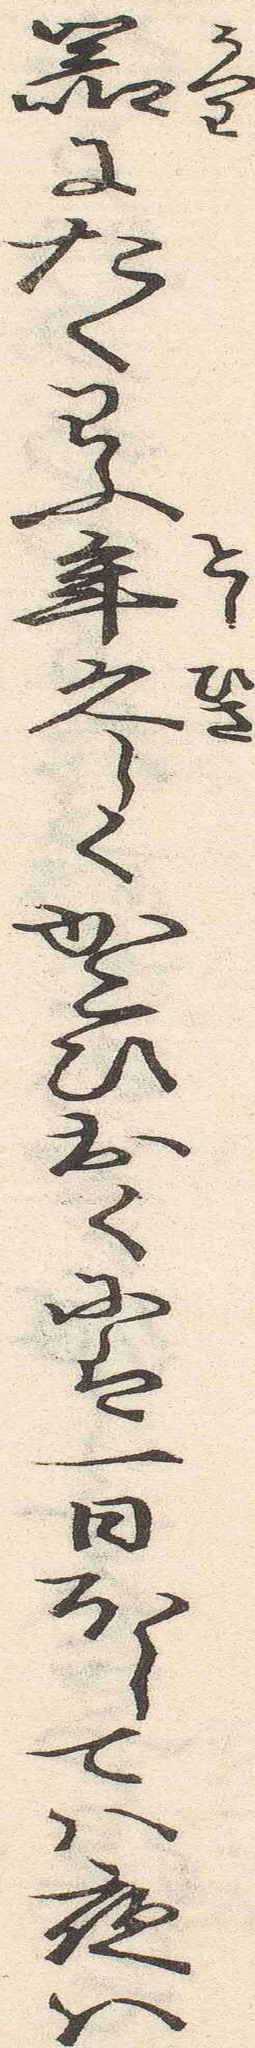器にたくわふ年久しくかこひおくには一日ほしては夜は
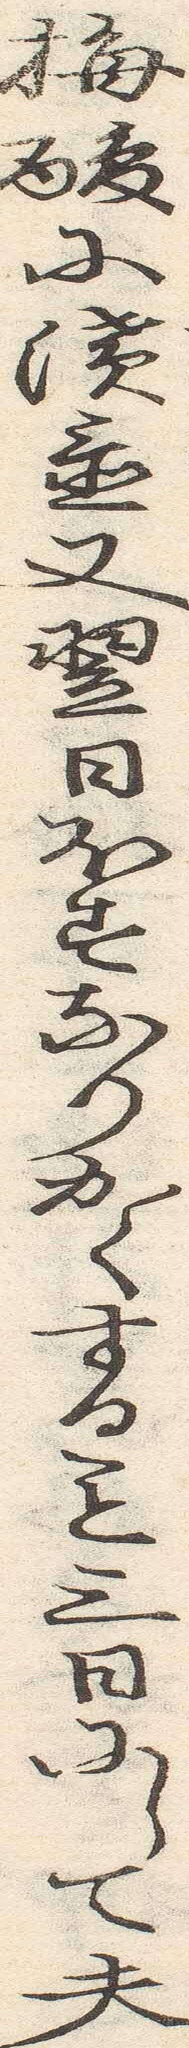梅酸に漬置又翌日ほすなりかくすること三日にして夫
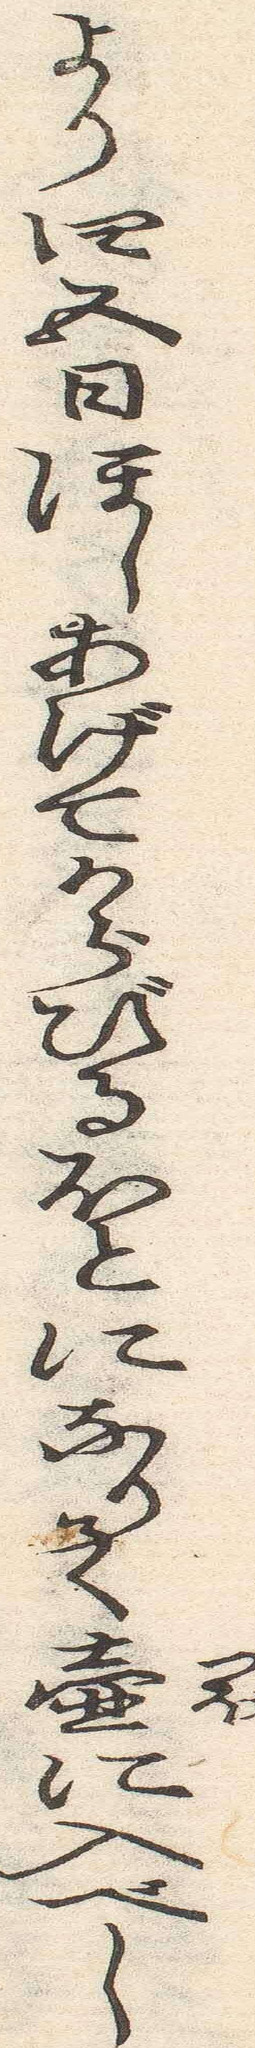より四五日ほしあげてからびるほとになりて壺に入べし
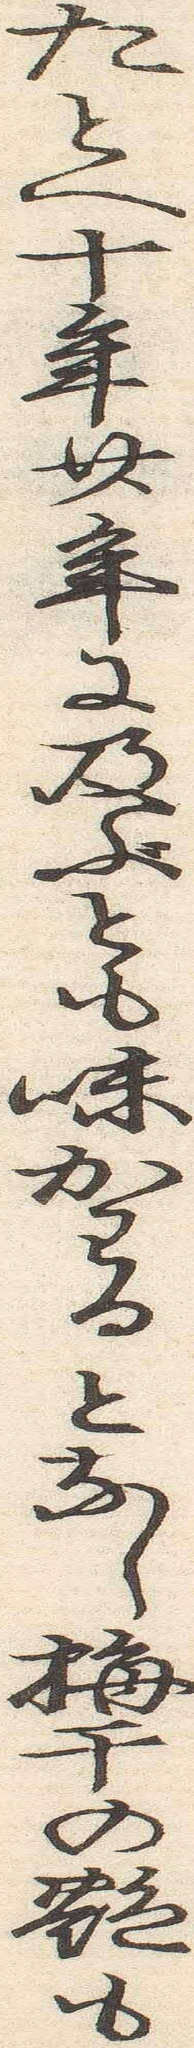たとへ十年廿年に及ぶとも味かわるとなし梅干の艶も
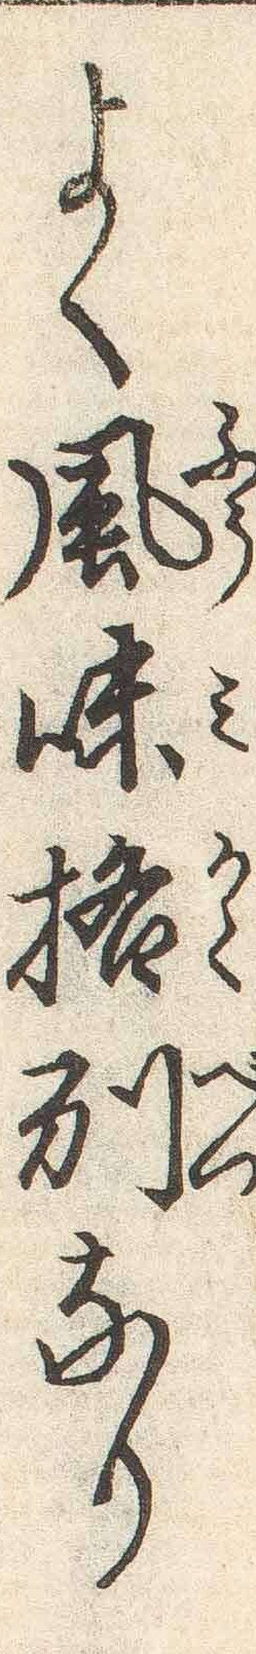よく風味格別なり
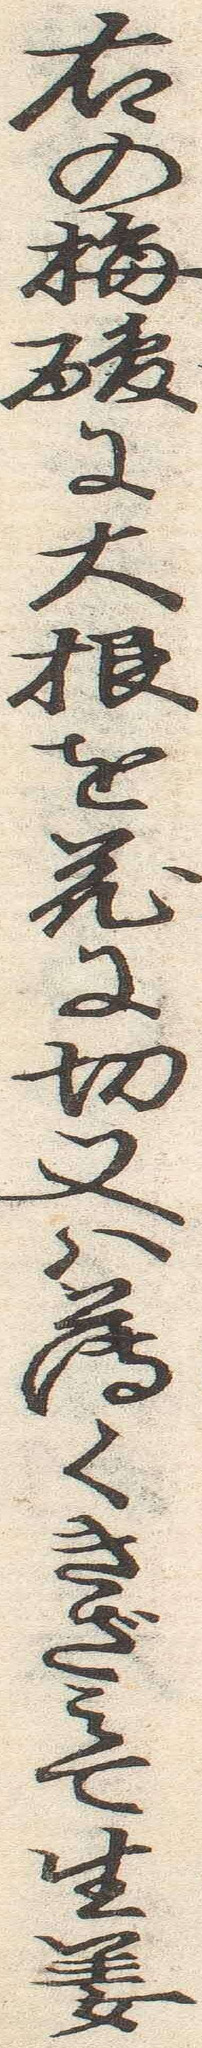右の梅酸に大根を花に切又は薄くきざみて生姜
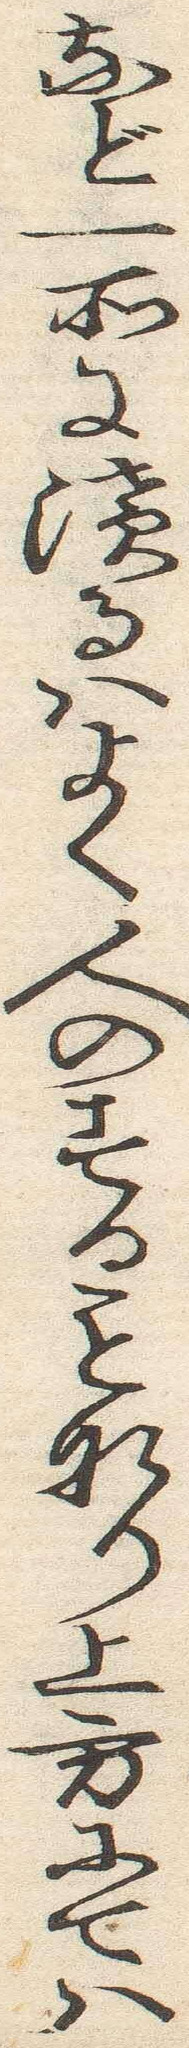など一所に漬るはよく人のすることなり上方にては
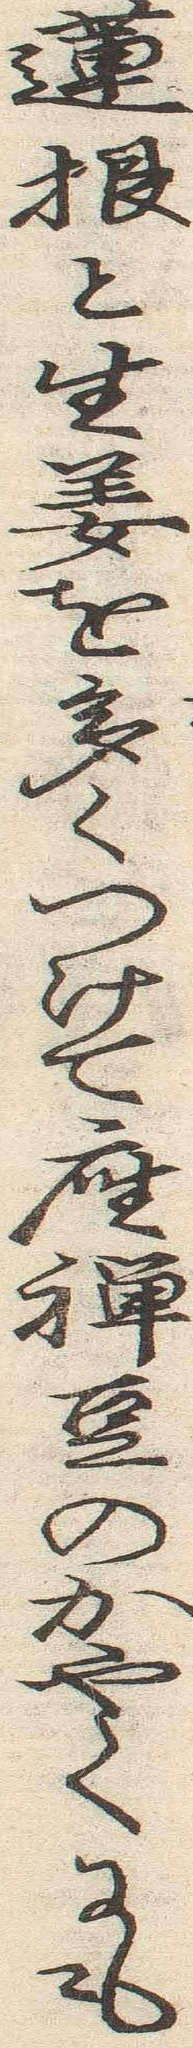蓮根生姜を多くつけて座禅豆のかやくにも

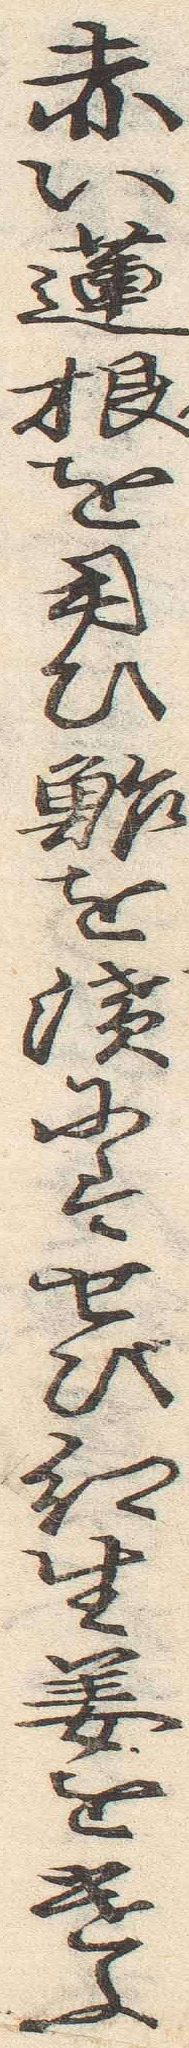赤い蓮根を用ひ鮓を漬にはせび紅生姜を遣ふ
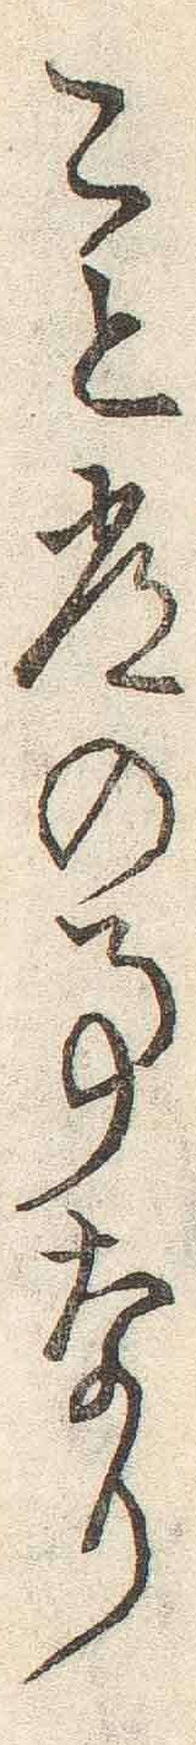こと常の事なり
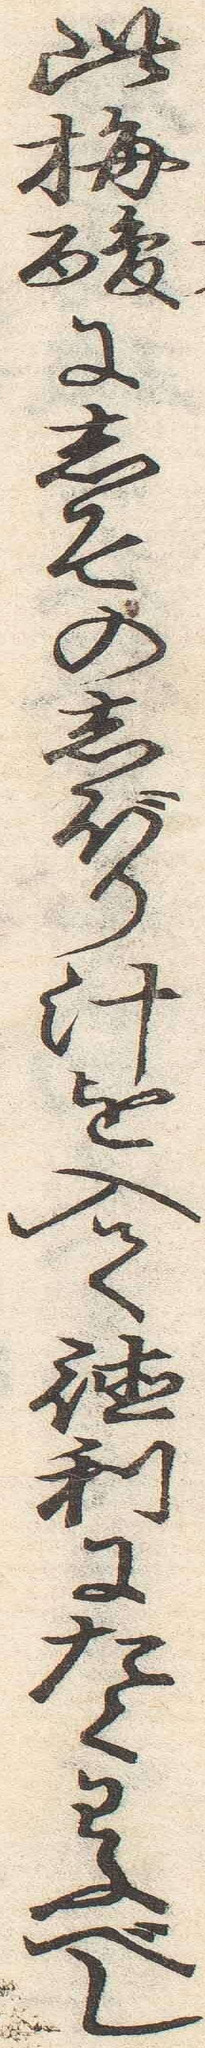此梅酸にしそのしぼり汁を入て徳利にたくわふべし
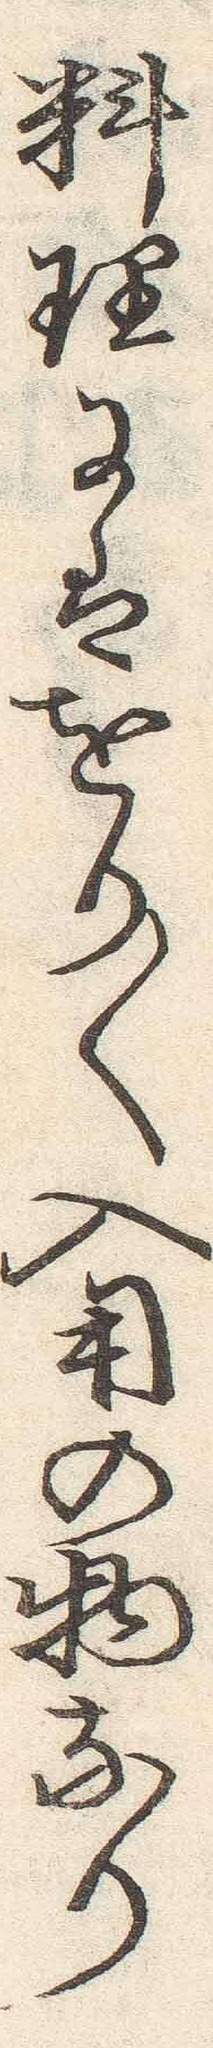料理にはをり〳〵入用の物なり
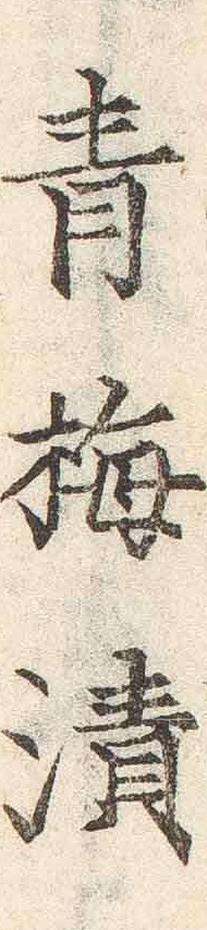青梅漬
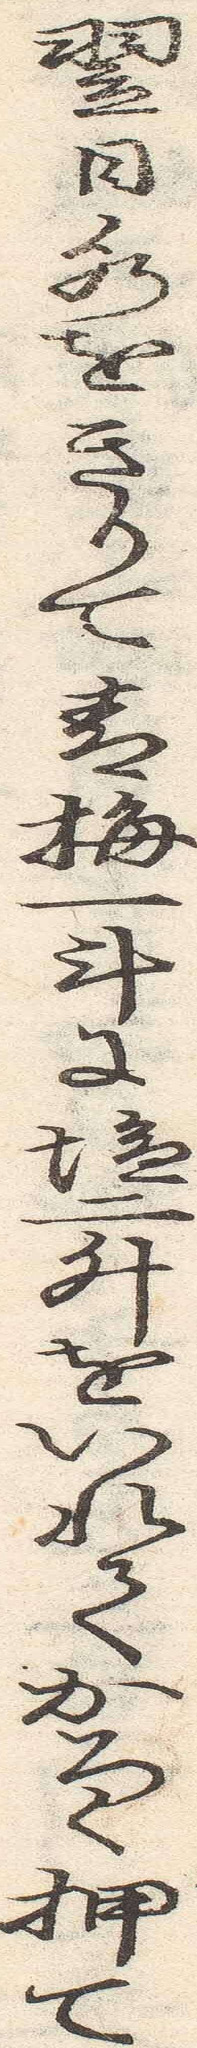翌日水をきりて青梅一斗に塩二升をいれてかろく押て
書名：四季漬物塩嘉言
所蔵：東京学芸大学附属図書館 国文学研究資料館
